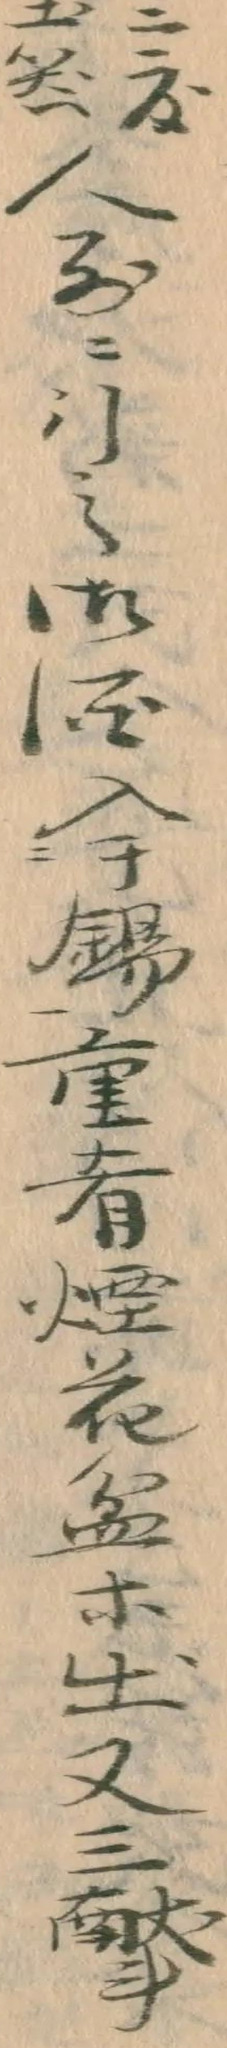三度土器人別ニ引之御酒入于錫重肴煙花盆等出又三献斗
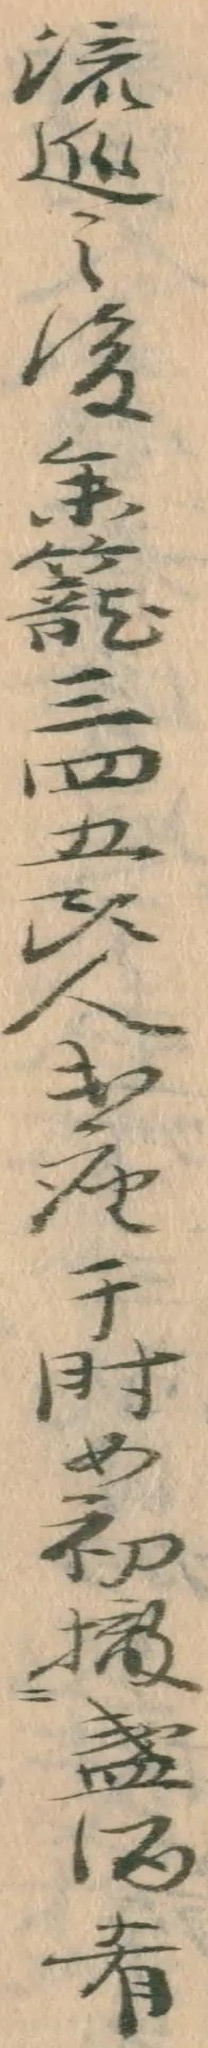流巡之後参籠三四五頭人出座于時如初撒盞酒肴
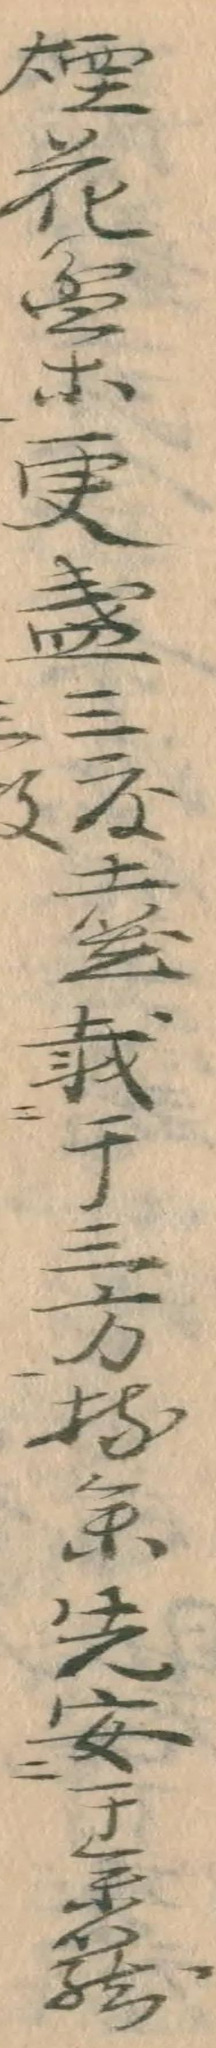煙花盆等更盞三度土器三枚載于三方持参先安于参籠
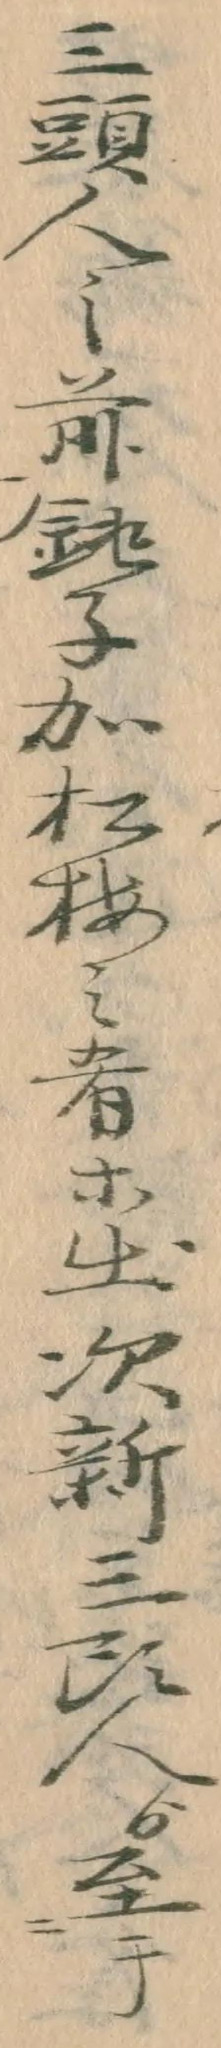三頭人之前銚子加松梅之肴等出次新三頭人ゟ至于
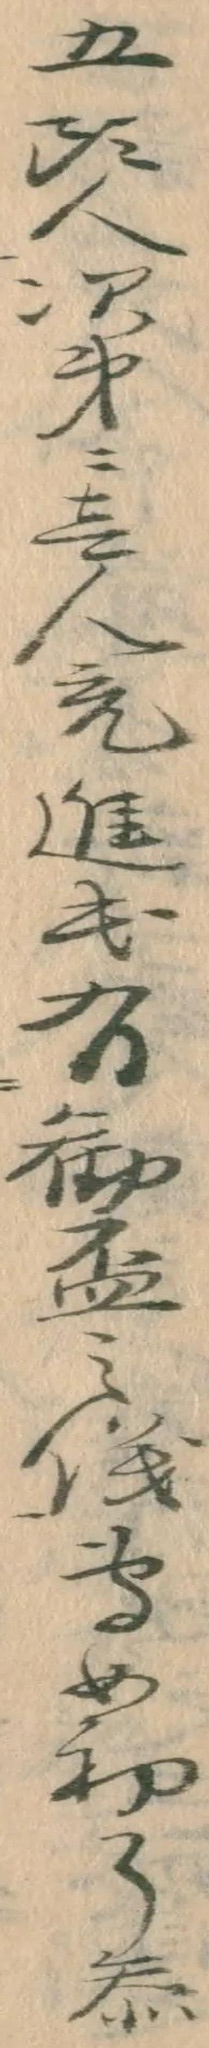五頭人次第ニ壱人充進出有勧盃之儀處如初了参
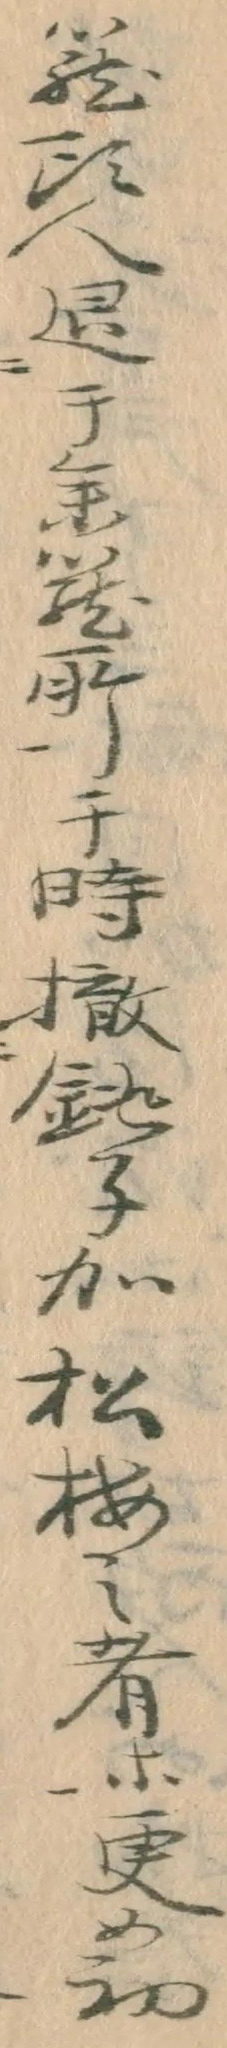籠頭人退于参籠所于時撒銚子加松梅之肴等更如初

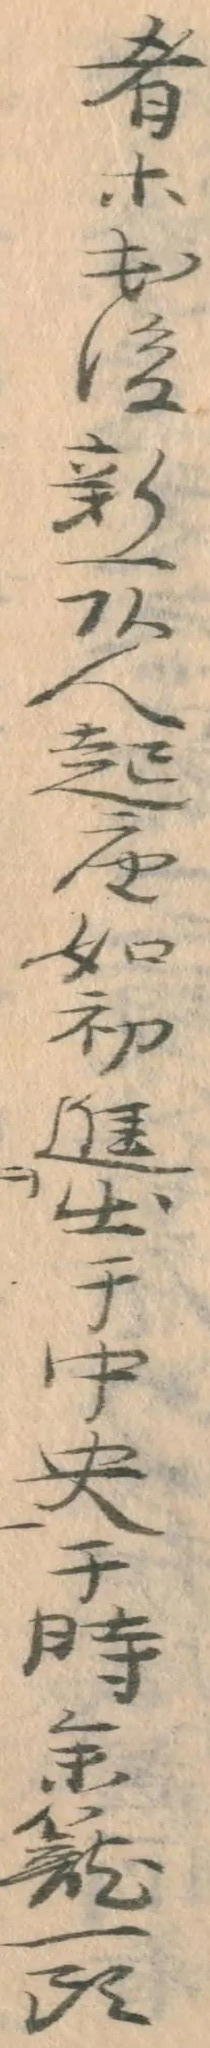肴等出後新一頭人起座如初進出于中央于時参籠一頭
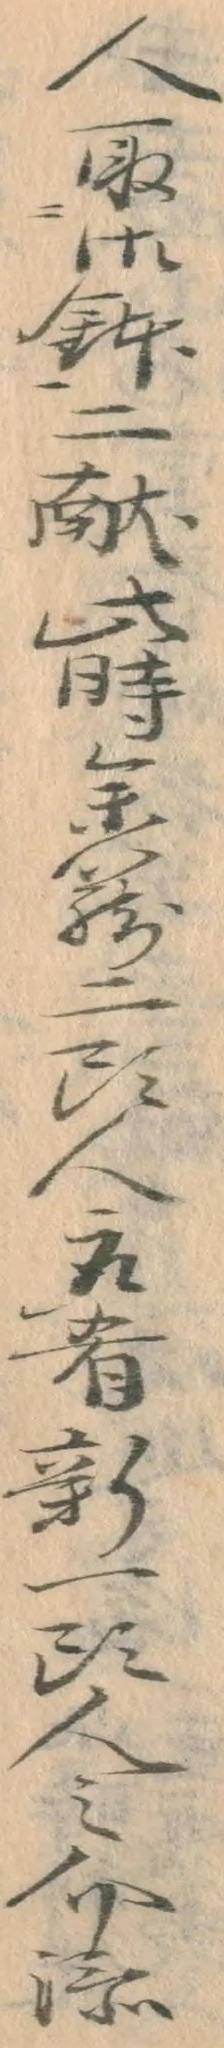人取御鉢二献此時参籠二頭人取肴新一頭人之介添
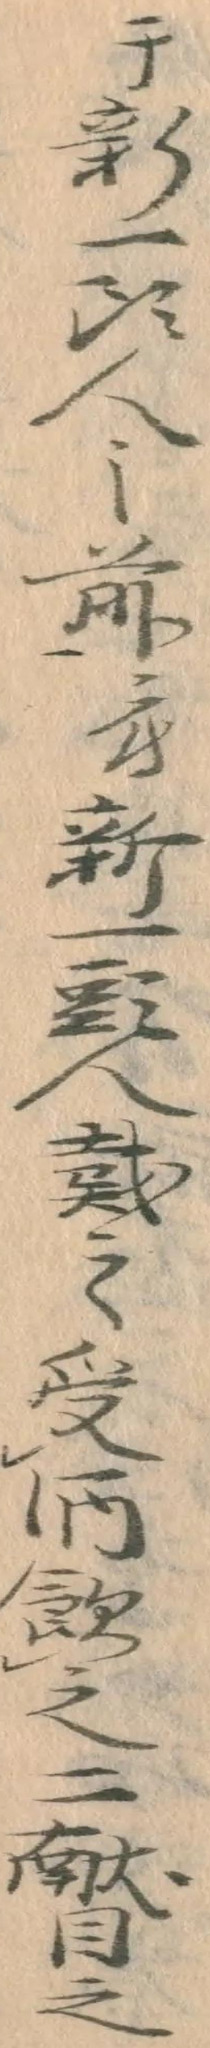于新一頭人之前ニ付新一頭人載之受酒飲之二献目之
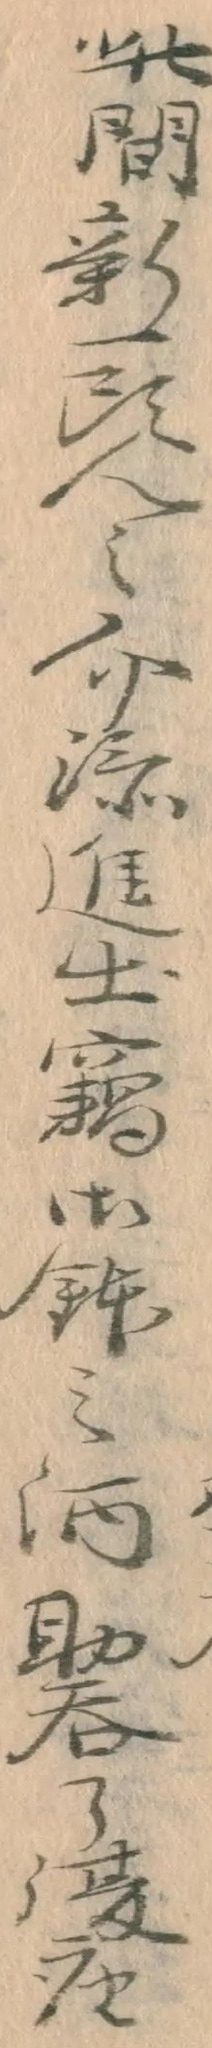此間新一頭人之介添進出比竊御鉢之酒助呑了復座
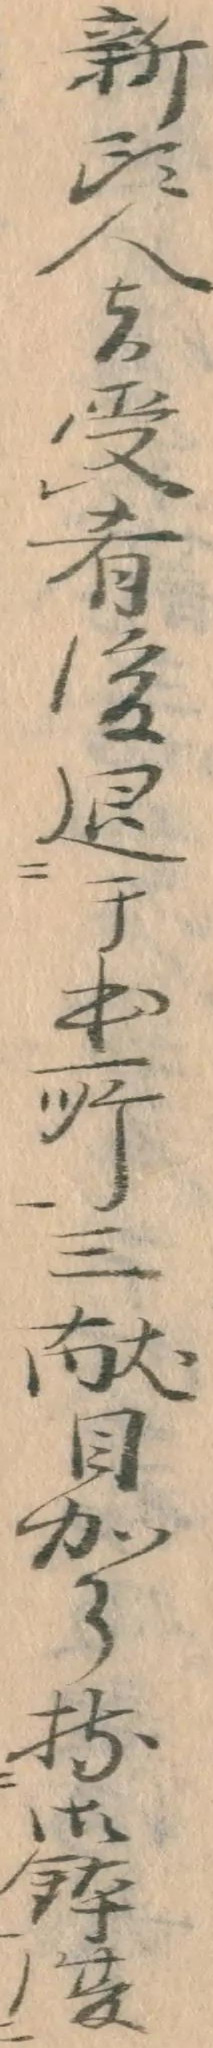新頭人者受有後退于本所三献目加終了持御鉢復
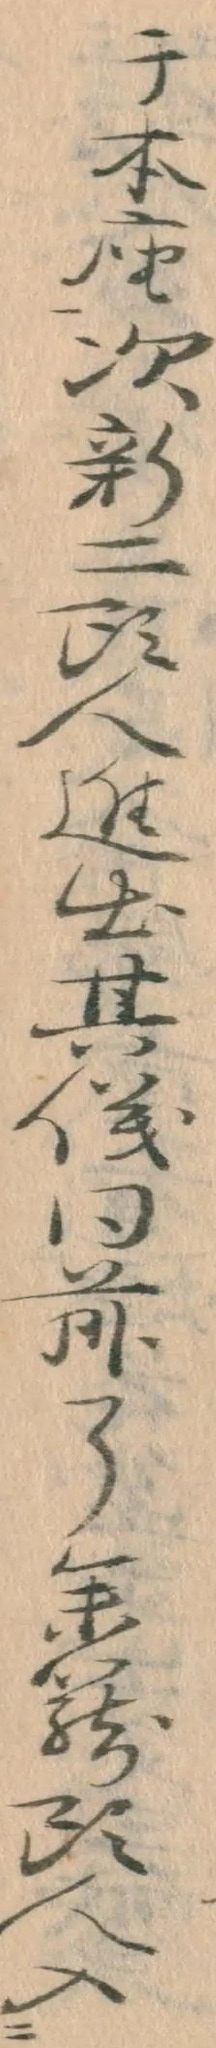于本座次新二頭人進出其儀同前了参籠頭人入
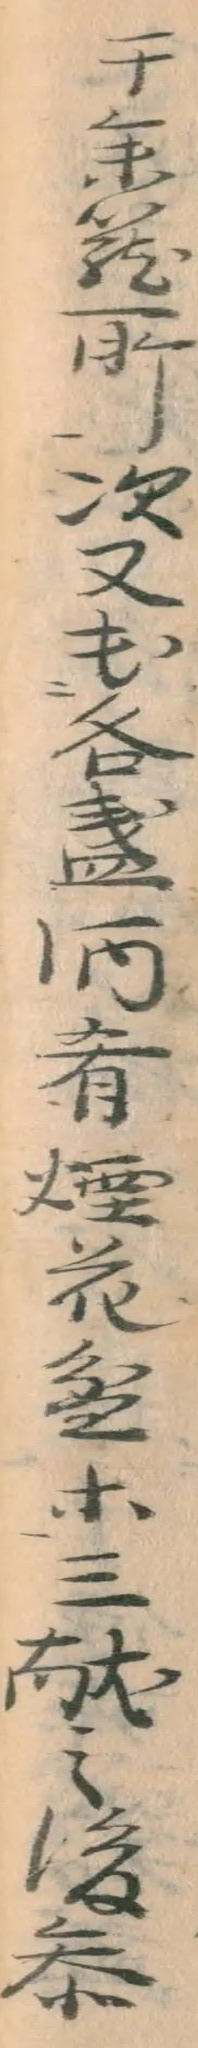于参籠所次又出各盞酒肴煙花盆等三献之後参
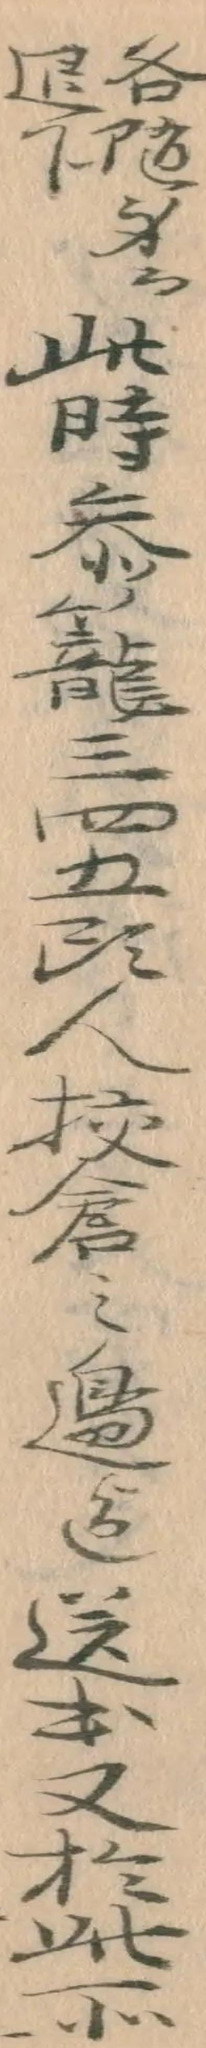各随身而退下此時参籠三四五頭人校倉之邊迄送出又於此所
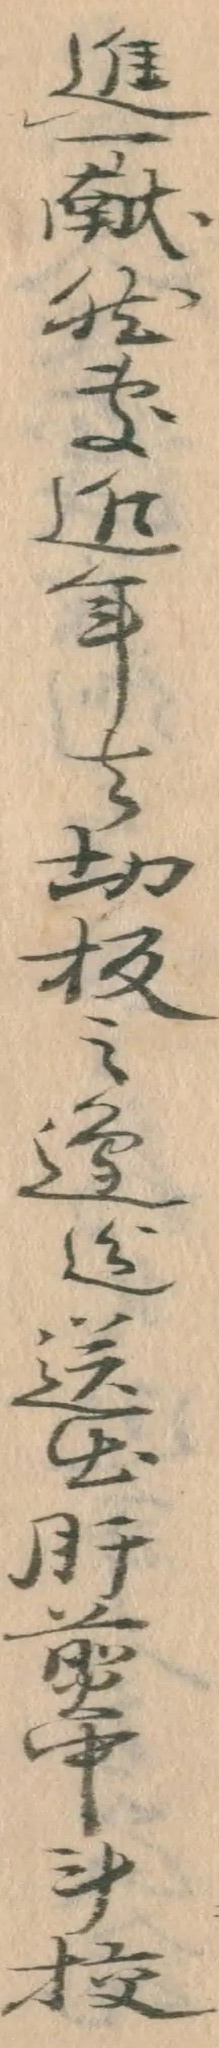進一献然處近年は切板之邊迄送出肝煎中斗校
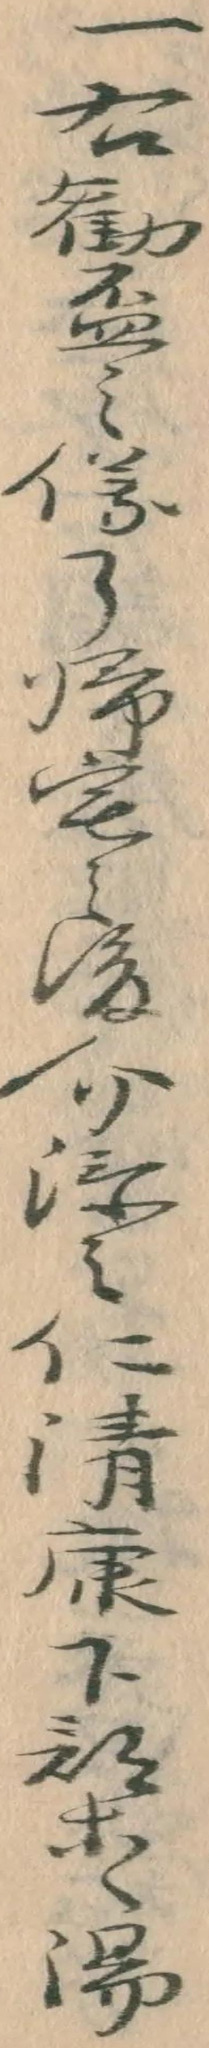一右勧盃之儀了帰宅之後介添之仁清康下部等へ湯
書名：賀茂社記録. 第72冊
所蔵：国立国会図書館 National Diet Library, JAPAN
